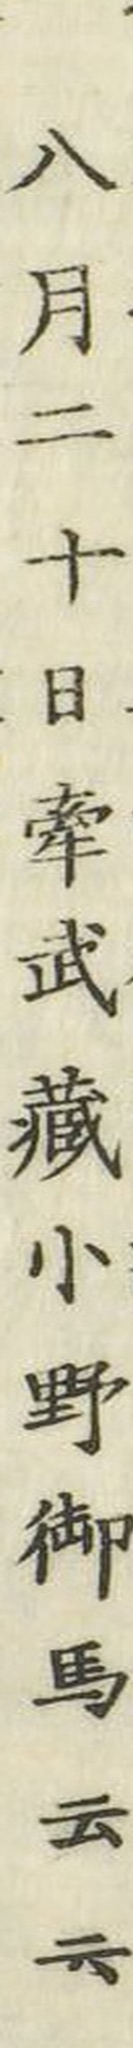八月二十日牽武蔵小野御馬云々
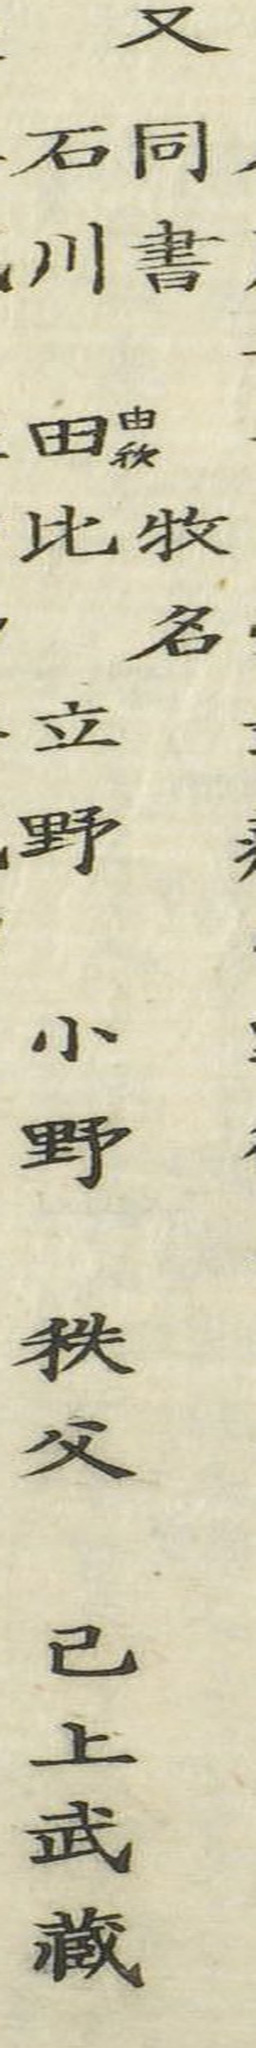石川田比立野小野秩父己上武蔵
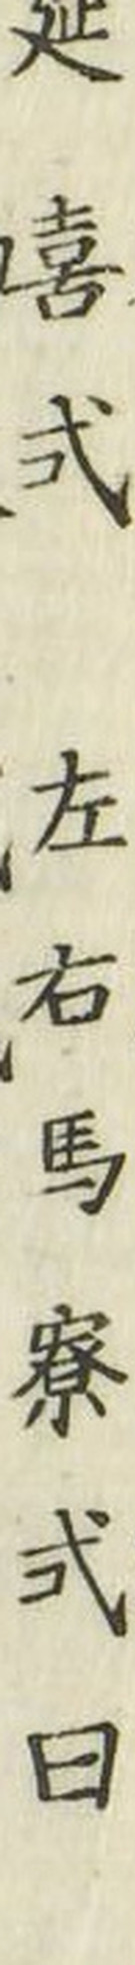延喜式左右馬寮式曰
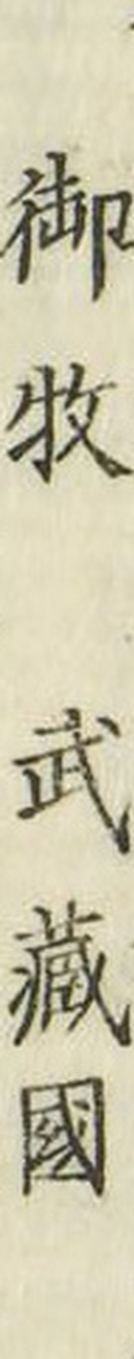御牧武蔵国
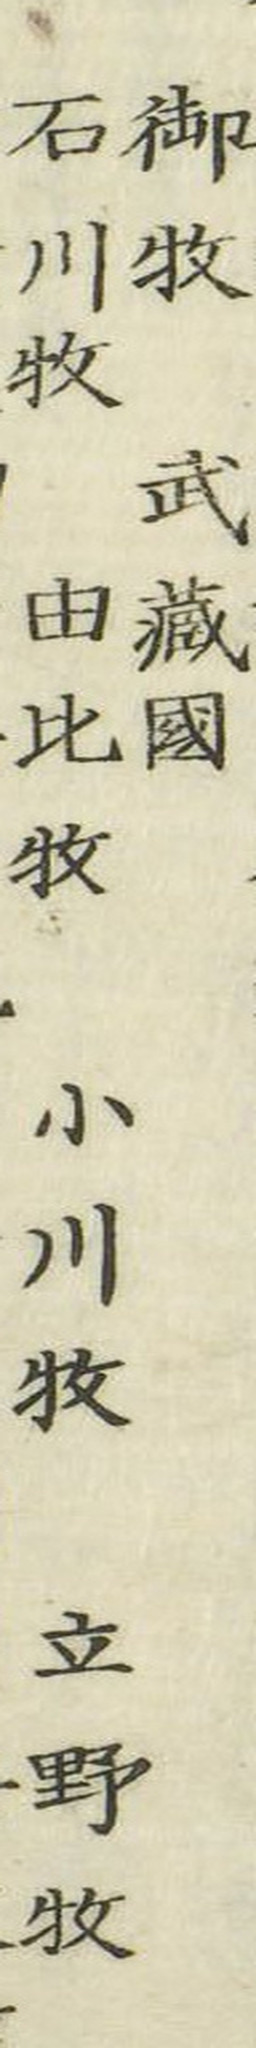石川牧由比牧小川牧立野牧
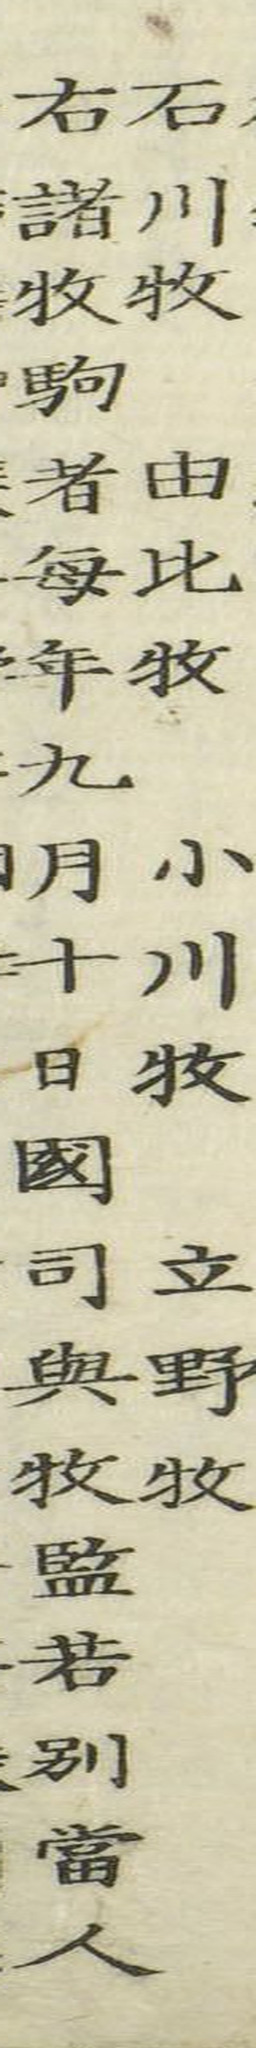右諸牧駒者毎年九月十日国司与牧監若別当人
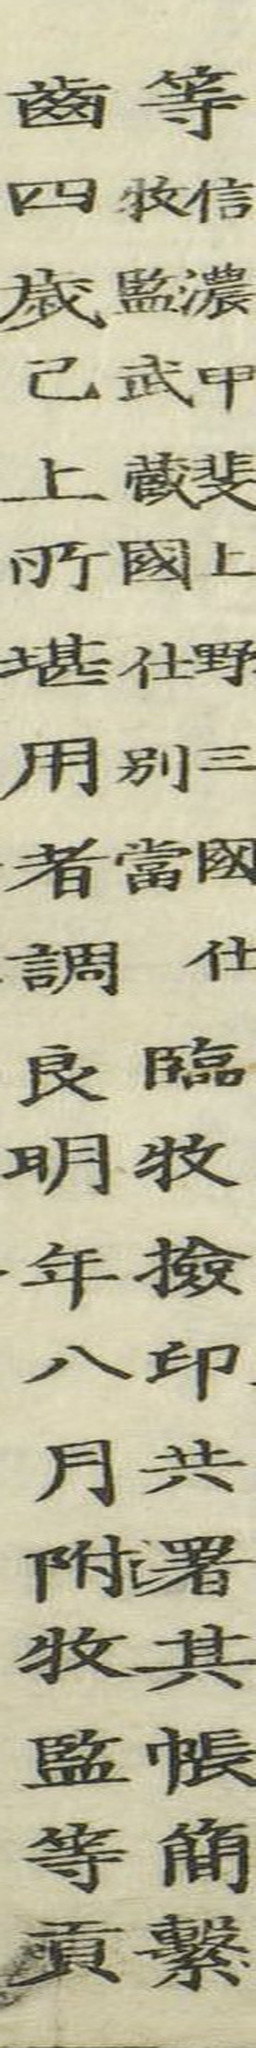歯四歳己上所堪用者調良明年八月附牧監等貢
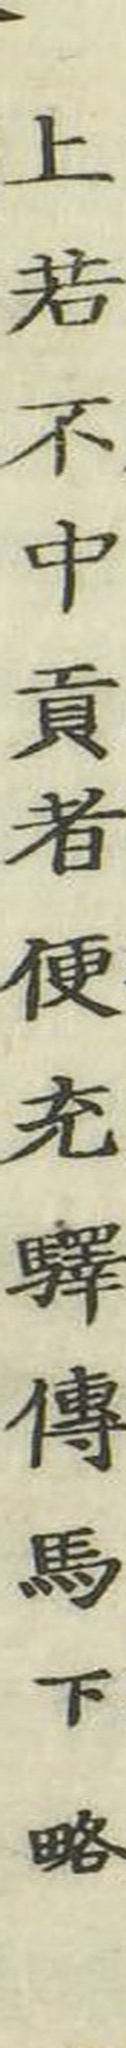上若不中貢者便充駅伝馬下略
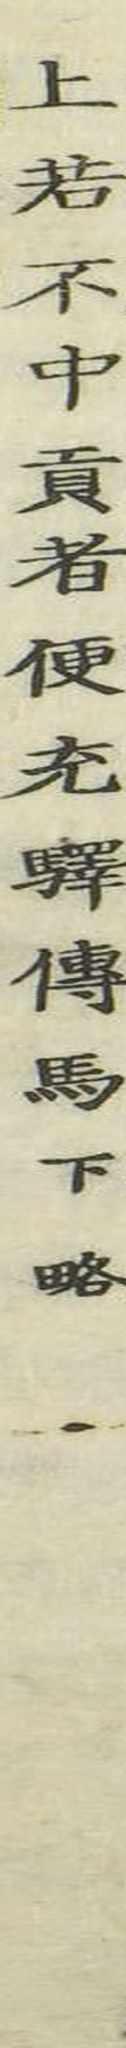上若不中貢者便充駅伝馬下略

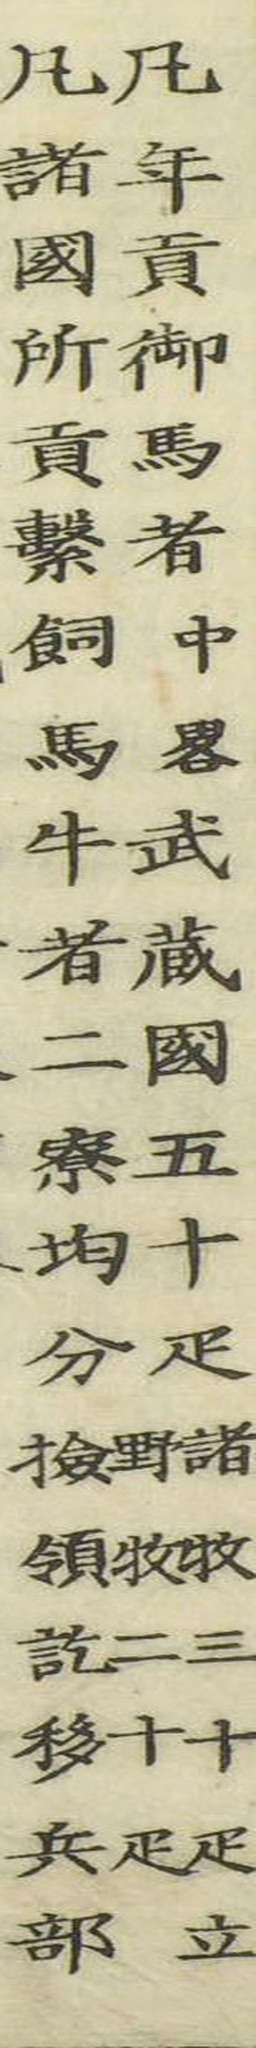凡諸国所貢繋飼馬牛者二寮均分検領訖移兵部
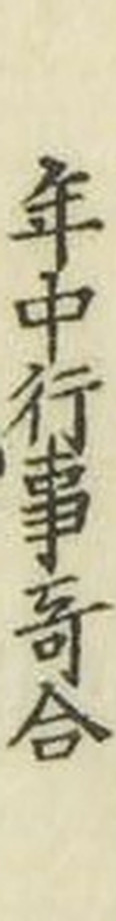年中行事哥合
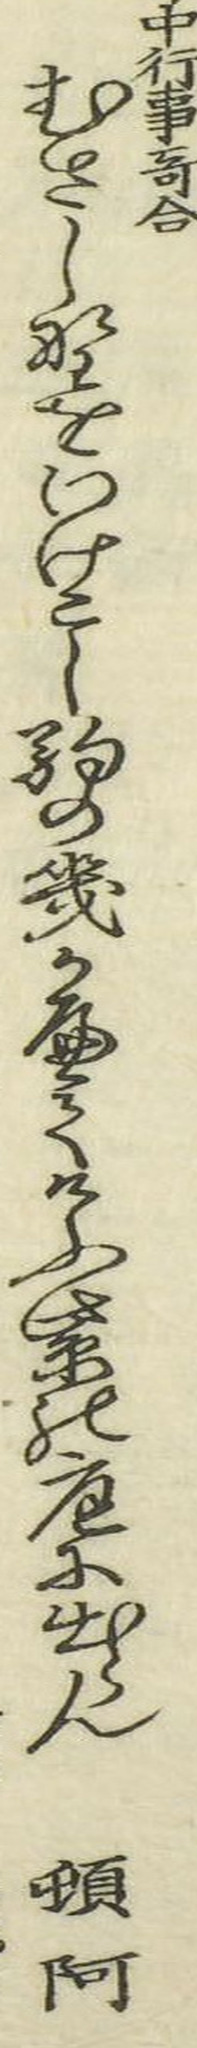むさし野をわけこし駒の幾かへてけふ紫の庭に出らん頓阿
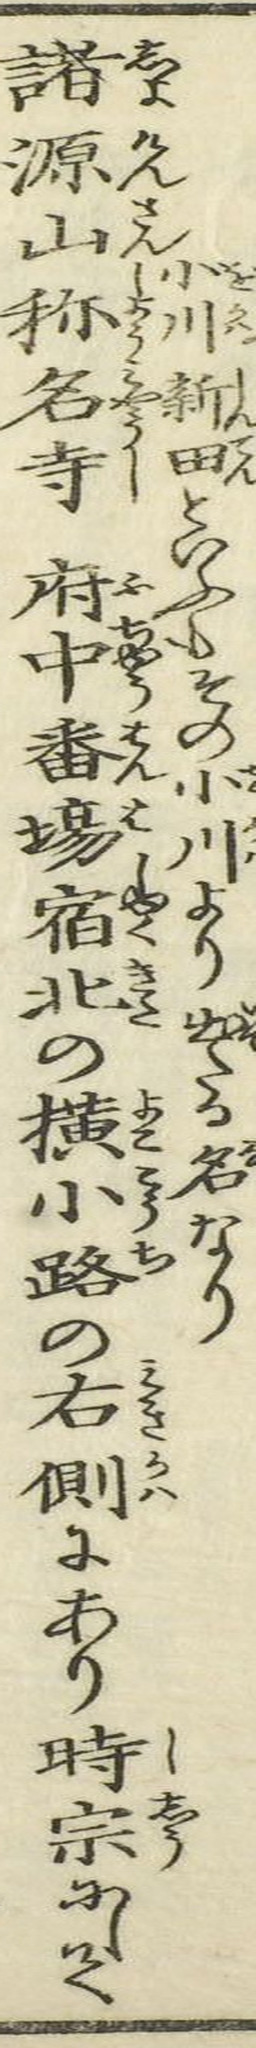諸源山称名寺府中番場宿北の横小路の右側にあり時宗にして
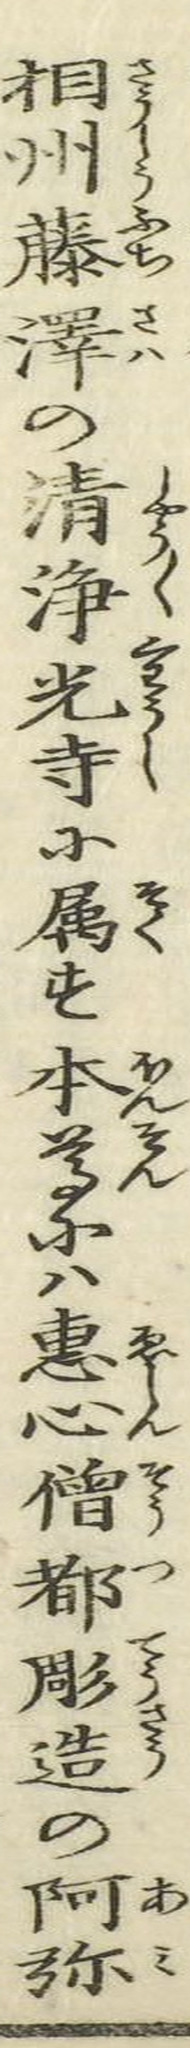相州藤沢の清浄光寺に属す本尊には恵心僧都彫造の阿弥
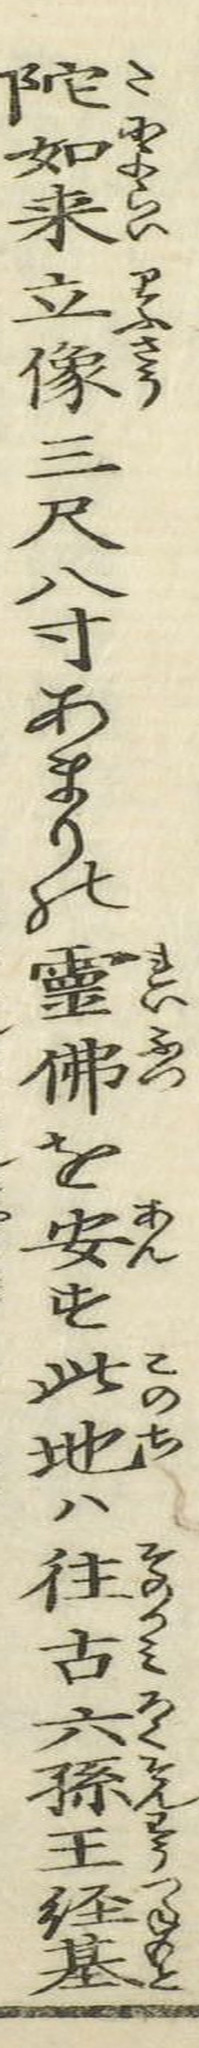陀如来立像三尺八寸あまりの霊佛を安す此地は徃古六孫王経基
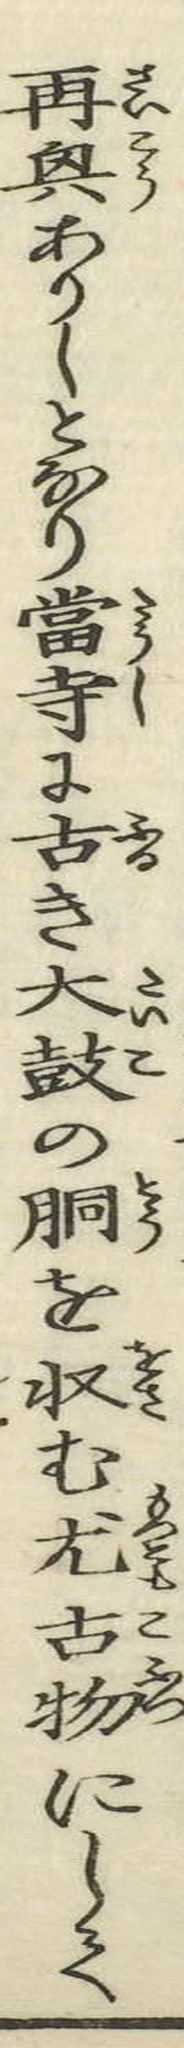再興ありしとなり当寺に古き太鼓の胴を収む尤古物にして
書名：江戸名所図会 20巻 巻之10
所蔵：東京学芸大学教育コンテンツアーカイブ
